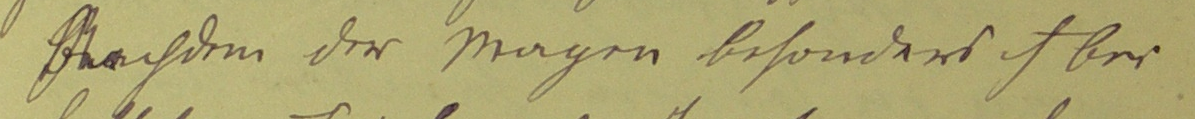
Nachdem der Magen besonders auch bei
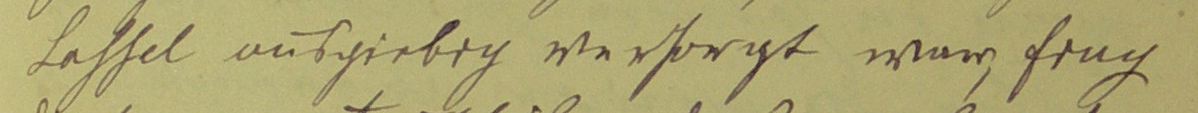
Lassel ausgiebeig versorgt war, fing
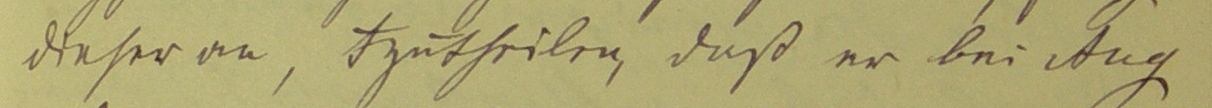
dieser an, mitzuteilen, daß er bei Aug.
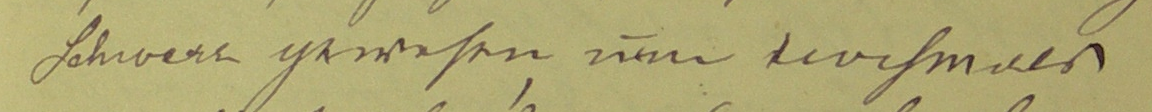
Schwarz gewesen um nochmals
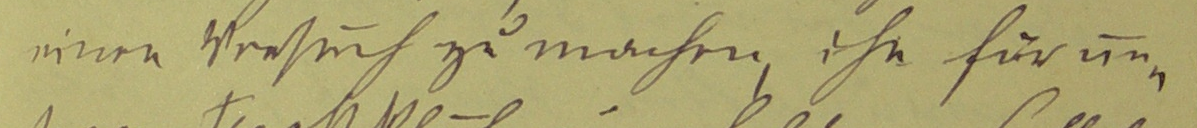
einen Versuch zu machen, ihn für un¬
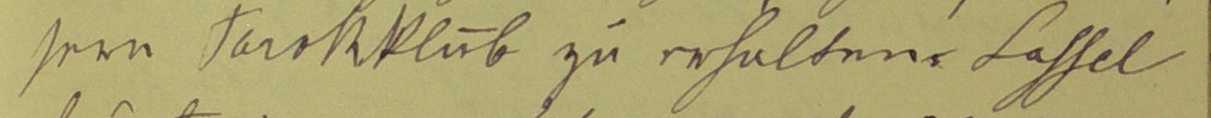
sern Tarockklub zu erhalten Lassel
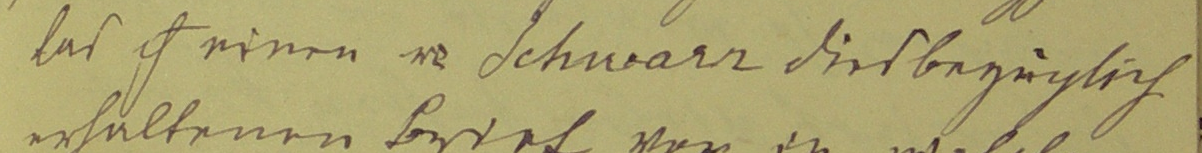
las auch einem von Schwarz diesbezüglich
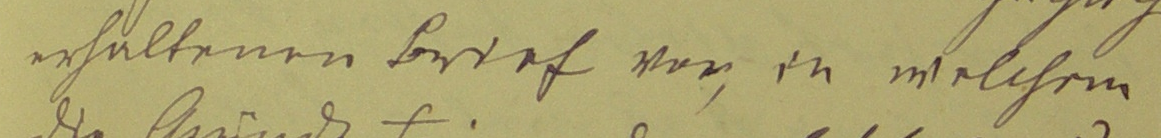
erhaltenen Brief vor, in welchem
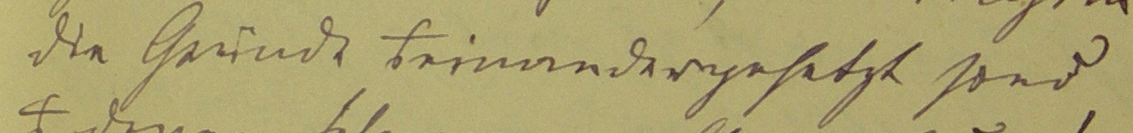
die Gründe auseinandergesetzt sind
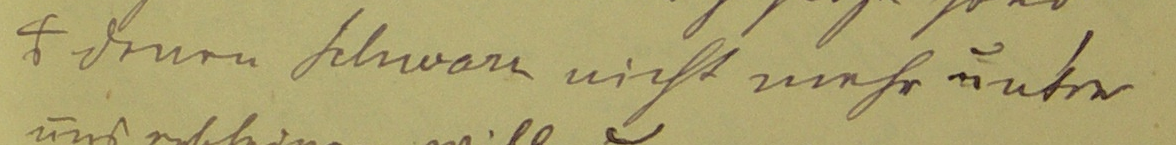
aus denen Schwarz nicht mehr unter
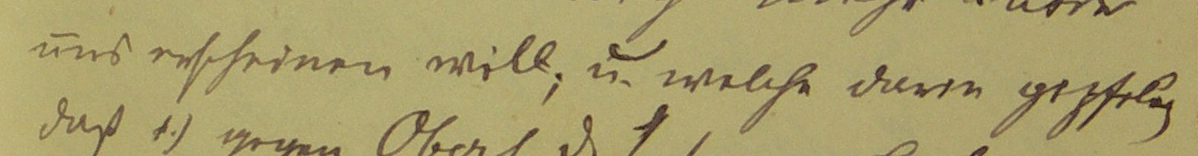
uns erscheinen will, und welche darin gipfeln
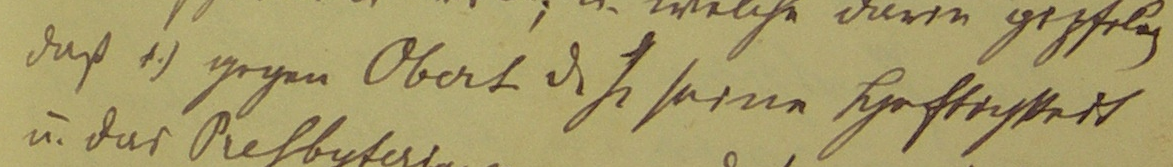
daß: 1) gegen Obert und auch seine Heftigkeit
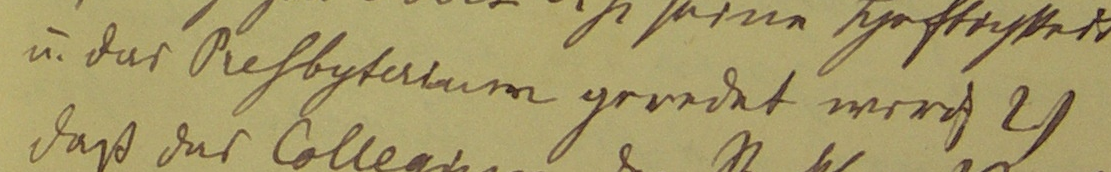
und das Presbyterium geredet wird,- 2)
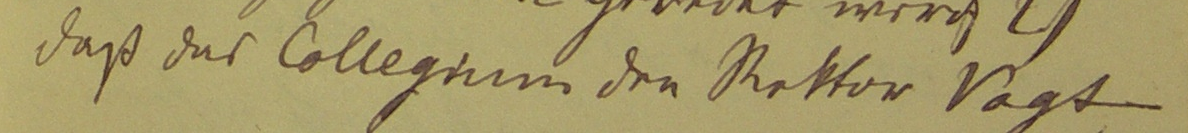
daß das Collegium den Rektor Vogt
